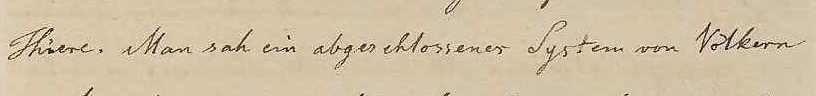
Thiere. Man sah ein abgeschlossenes System von Völkern
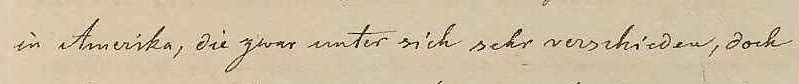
in Amerika, die zwar unter sich sehr verschieden, doch
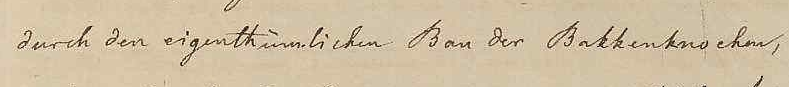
durch den eigenthümlichen Bau der Bakkenknochen,
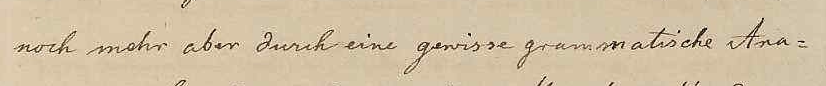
noch mehr aber durch eine gewisse grammatische Ana-
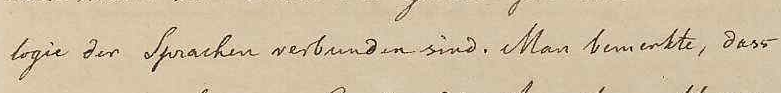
logie der Sprachen verbunden sind. Man bemerkte, dass
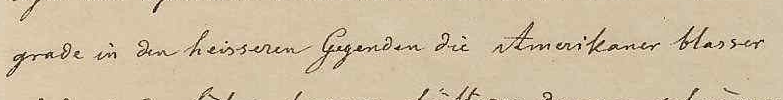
grade in den heisseren Gegenden die Amerikaner blasser
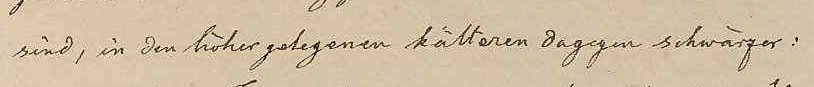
sind, in den höher gelegenen kälteren dagegen schwärzer:
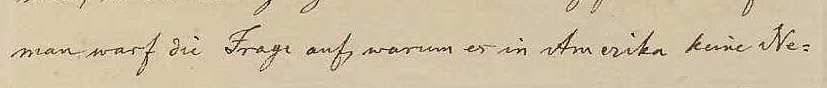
man warf die Frage auf, warum es in Amerika keine Ne-
